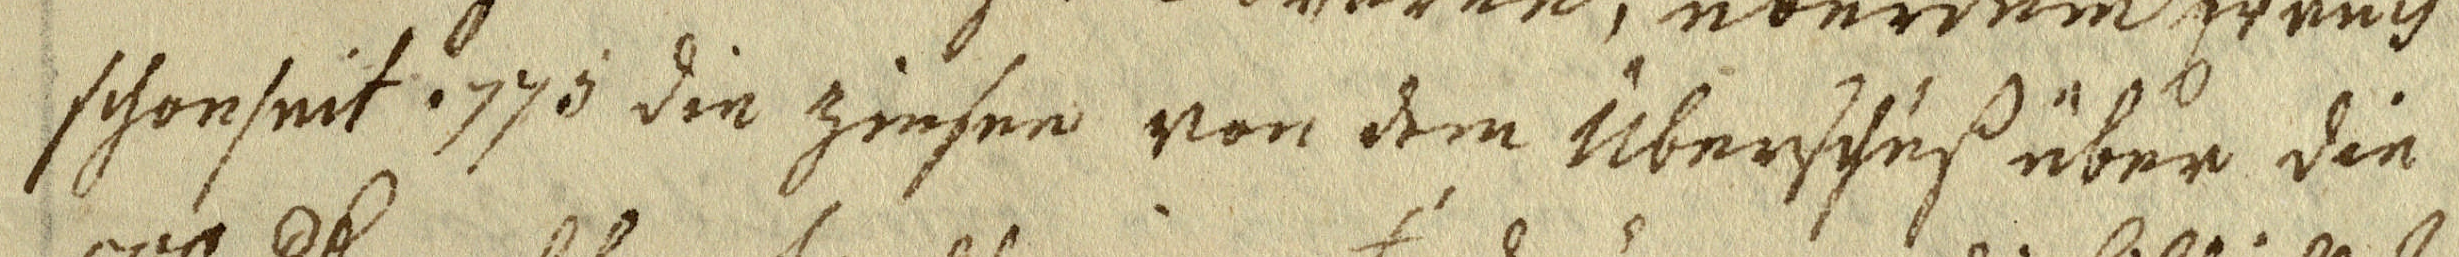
schon seit 1775 die Zinsen von dem Überschuß über die
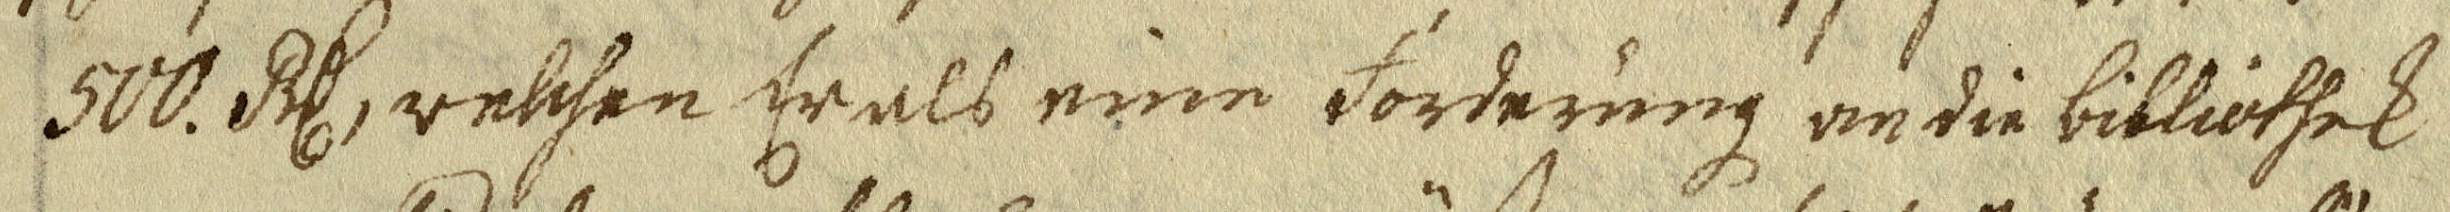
500 Rt., welchen Er als eine Forderung an die Bibliothek
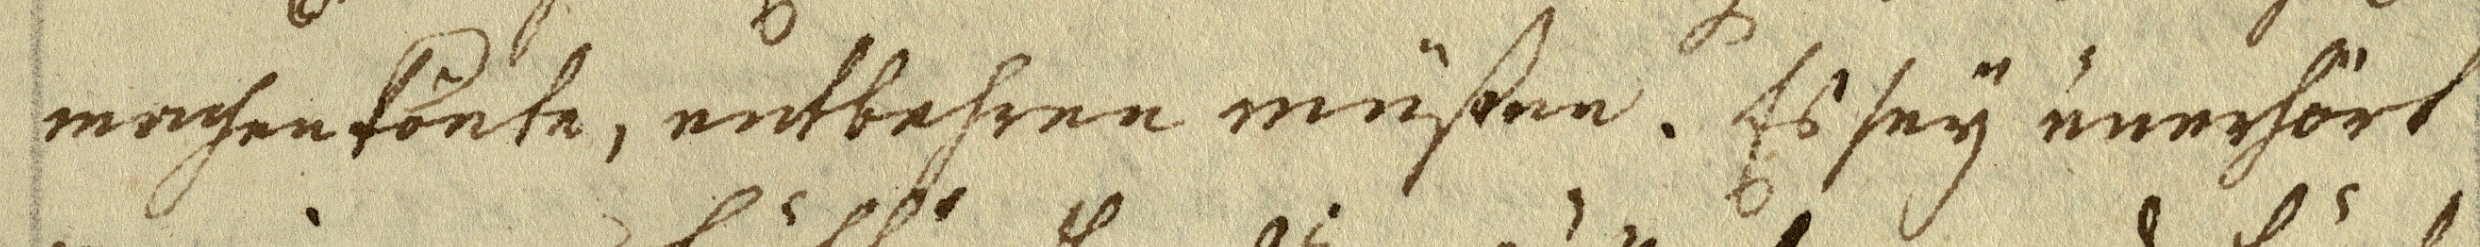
machen könte, entbehren müßen. Es seÿ unerhört
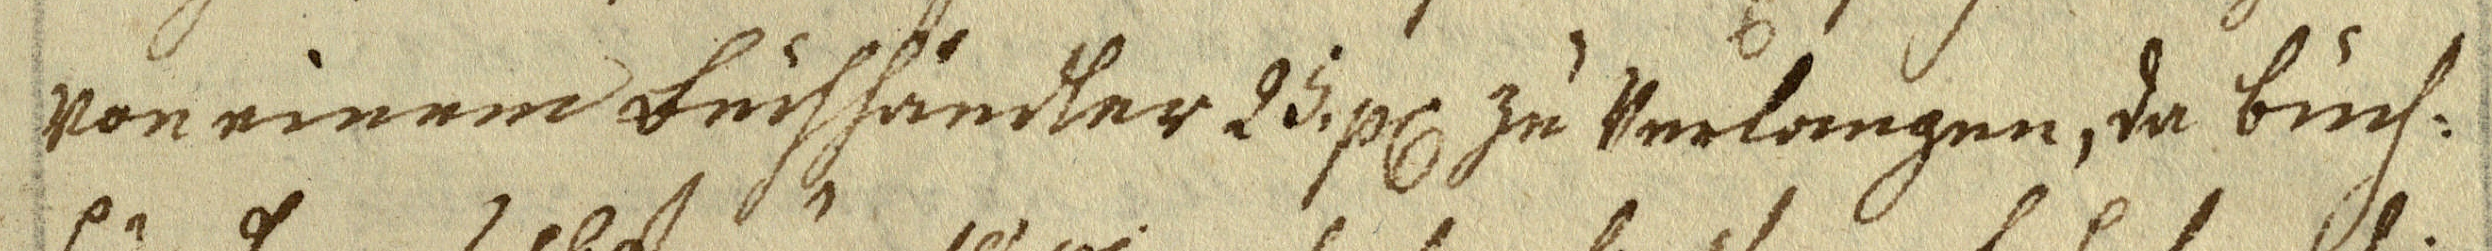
von einem Buchhändler 25 pc. zu verlangen, da Buch¬
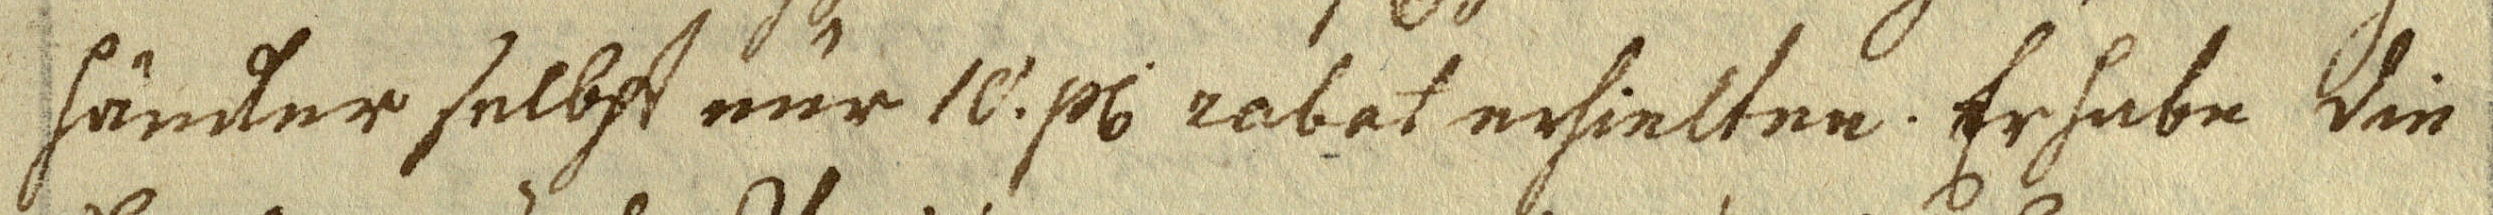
händler selbst nur 10 pc. rabat erhielten. Er habe die
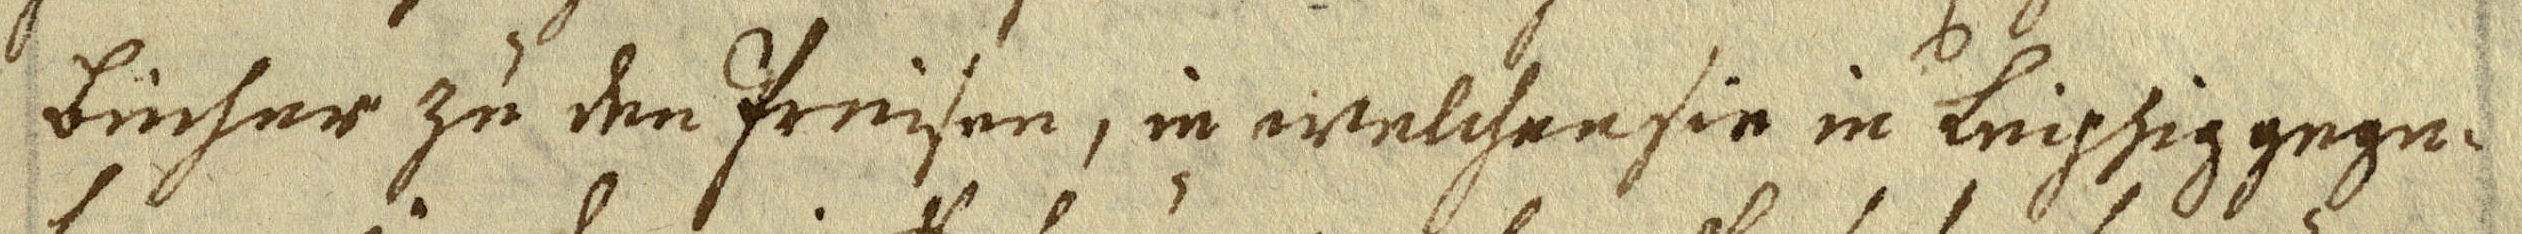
Bücher zu den Preisen, in welchen sie in Leipzig gege¬
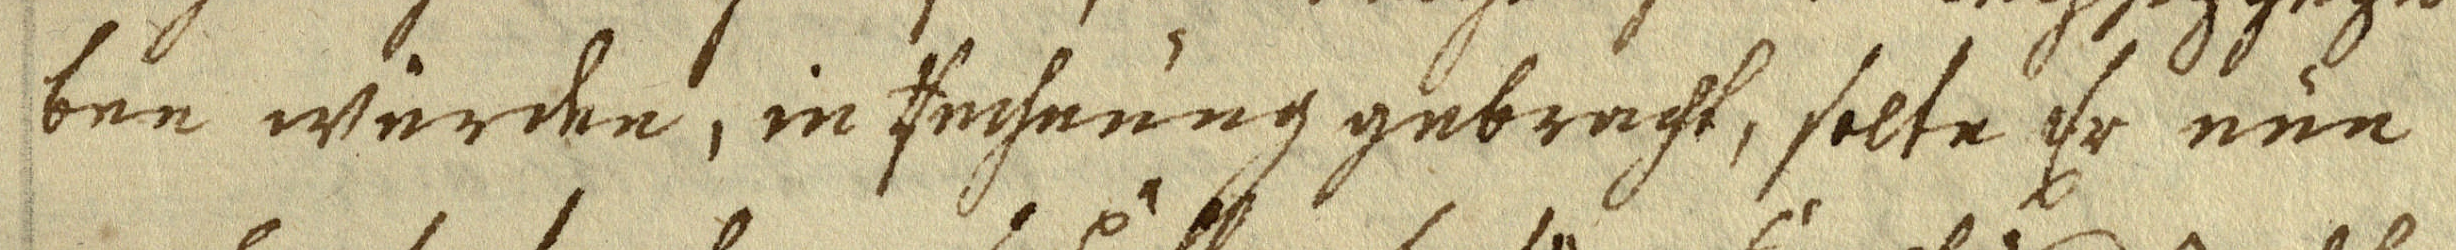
ben würden, in Rechnung gebracht, solte Er nun
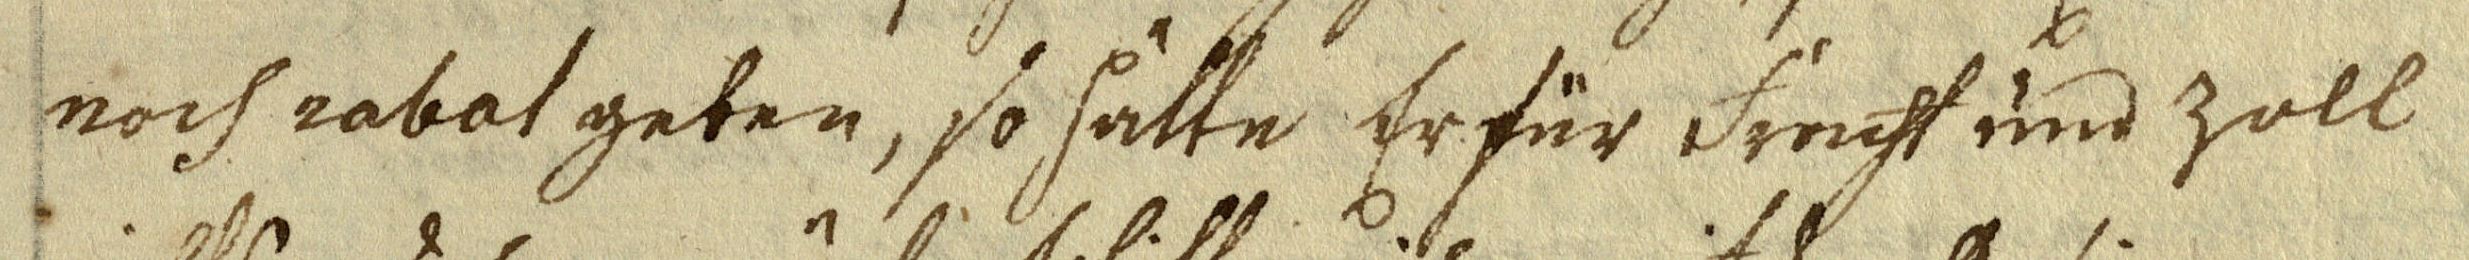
noch rabat geben, so hätte Er für Fracht und Zoll
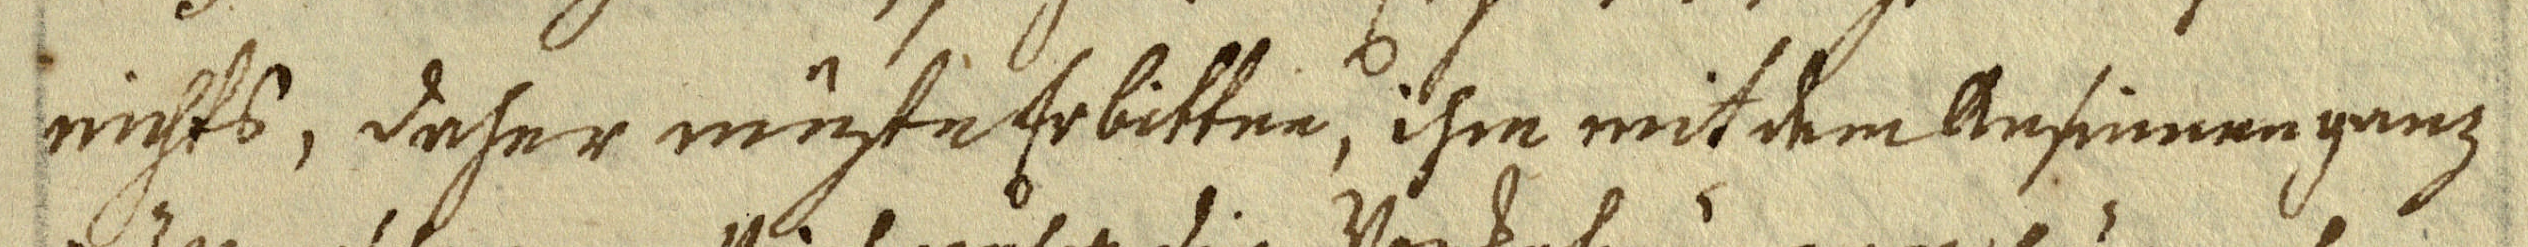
nichts, daher müste Er bitten, ihm mit dem Ansinnen gnaz
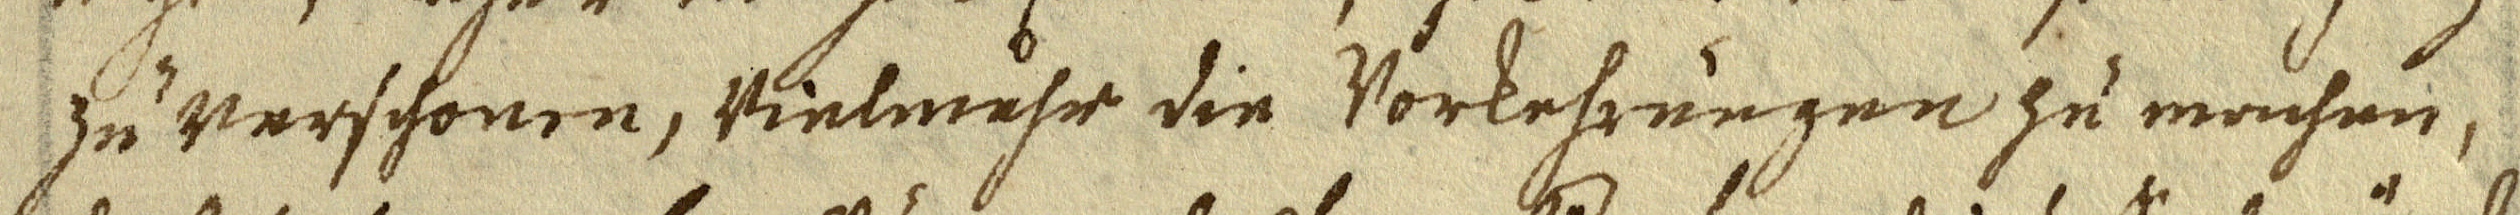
zu verschonen, vielmehr die Vorkehrungen zu machen,
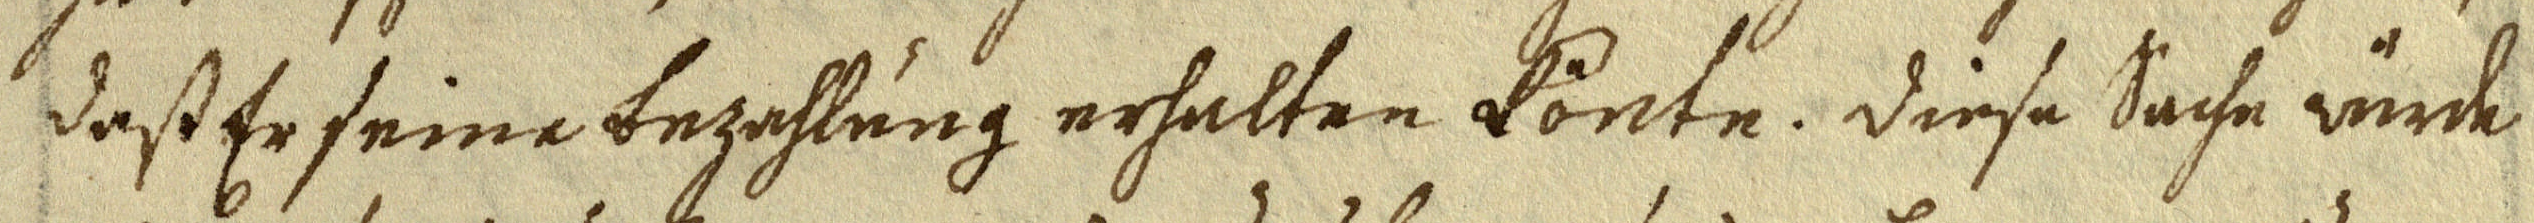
daß Er seine Bezahlung erhalten könte. Diese Sache würde
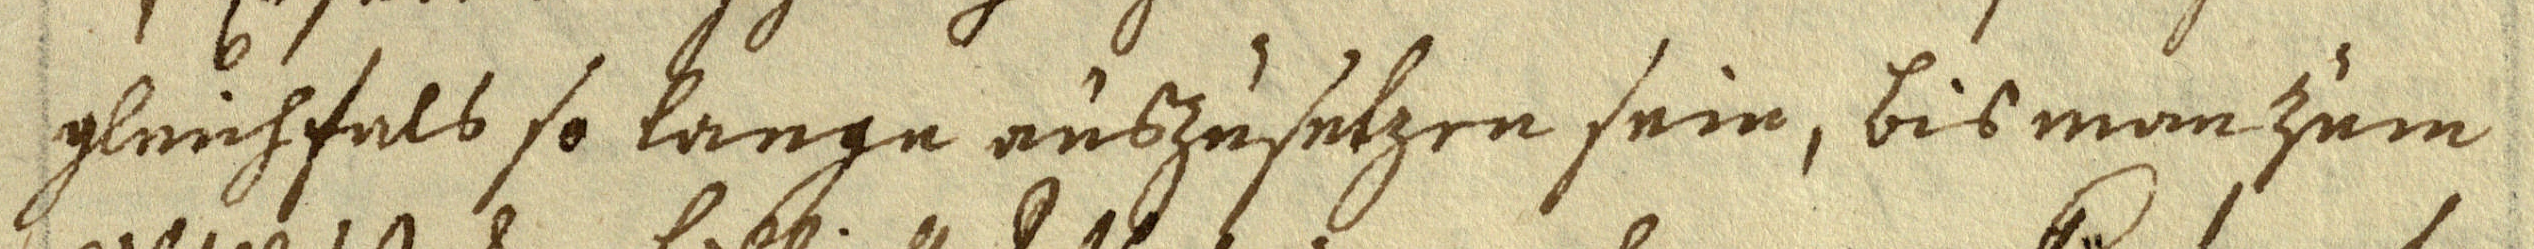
gleichfals so lange auszusetzen sein, bis man zum
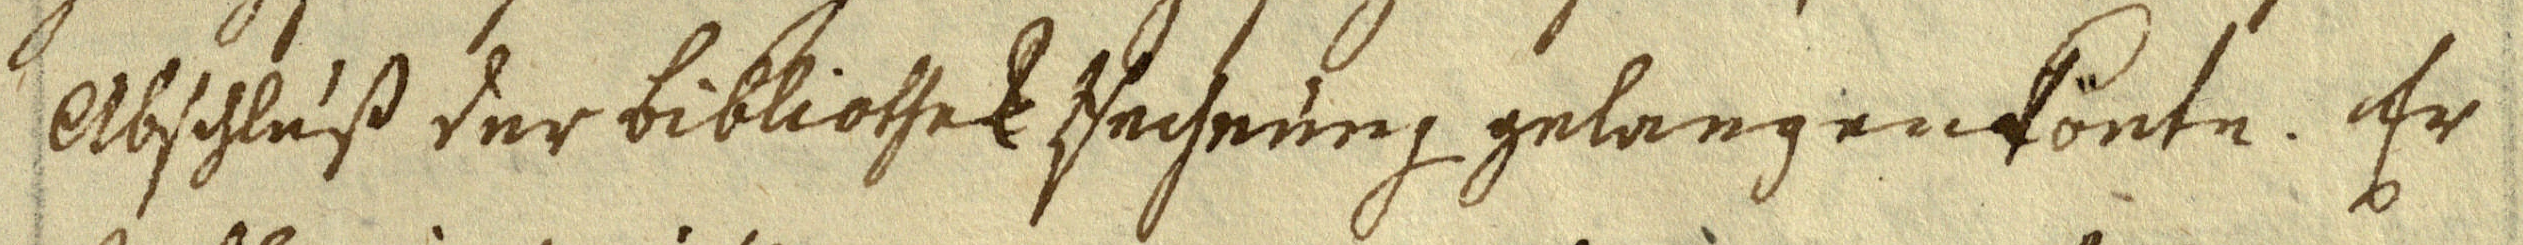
Abschluß der Bibliothek Rechnung gelangen könte. Er
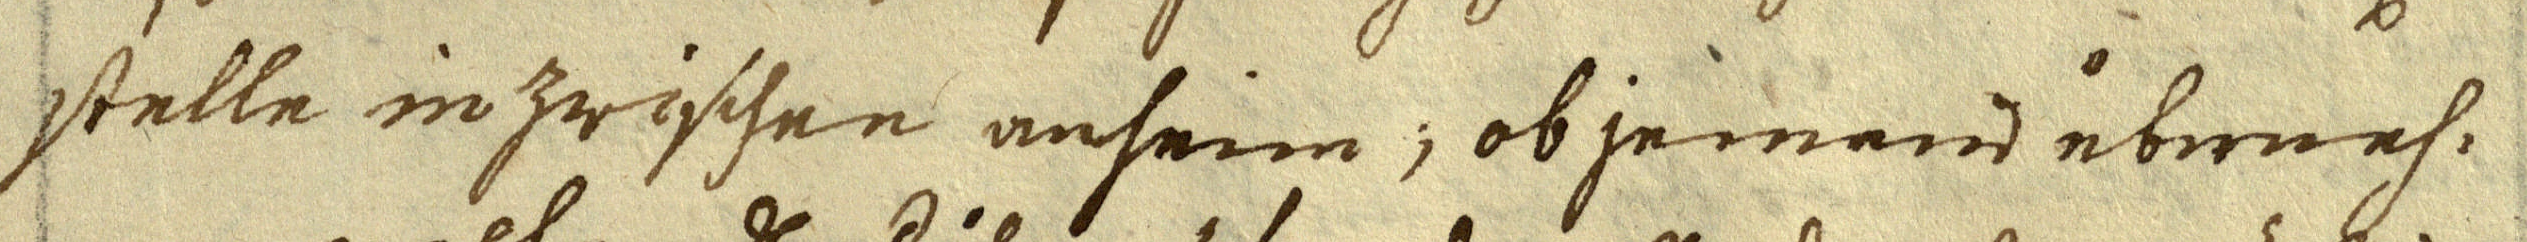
stelle inzwischen anheim; ob jemand überneh¬
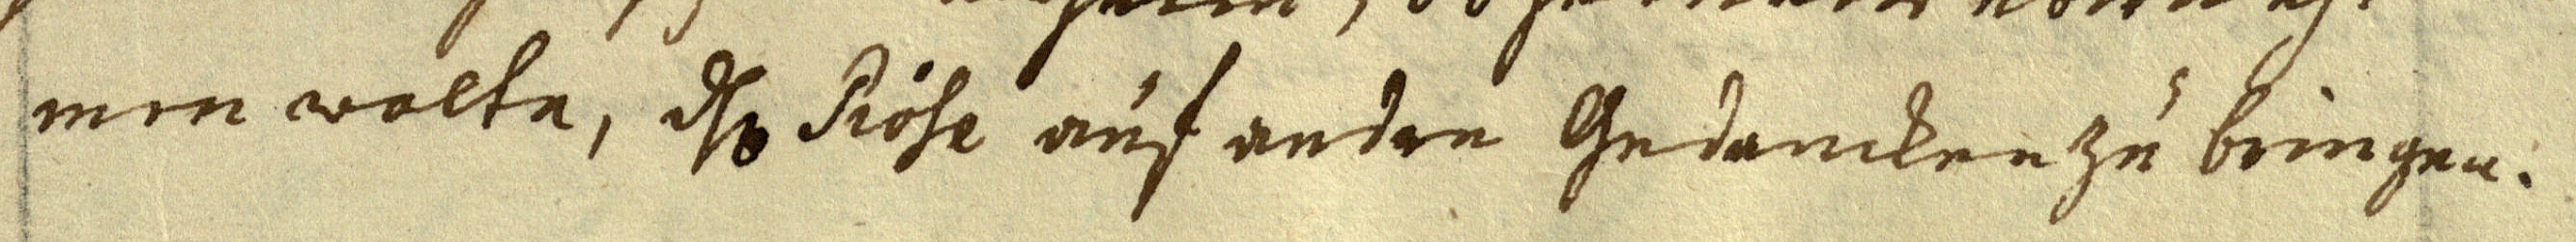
men wolte, dh Röse auf andre Gedancken zu bringen.
